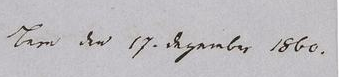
Bern den 17. Dezember 1860.
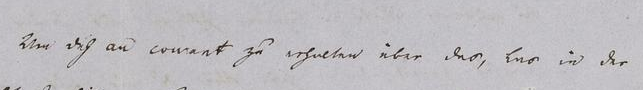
Um Dich au courant zu erhalten über das, was in der
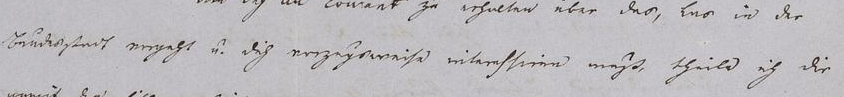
Bundesstadt vorgeht u. Dich vorzugsweise interessiren muß, theile ich Dir
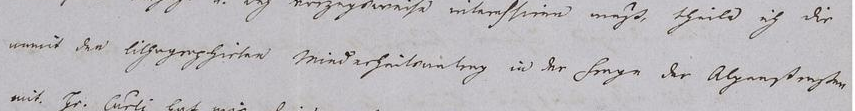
anmit den lithographirten Minderheitsantrag in der Frage der Alpenstraßen
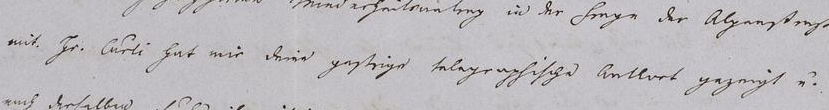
mit. Hr. Curti hat mir Deine gestrige telegraphische Antwort gezeigt u.
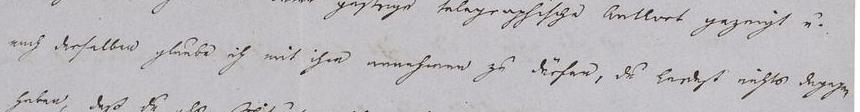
nach derselben glaube ich mit ihm annehmen zu dürfen, Du werdest nichts dagegen
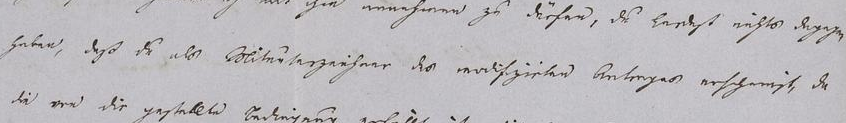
haben, daß Du als Mitunterzeichner des modifizirten Antrages erscheinst, da
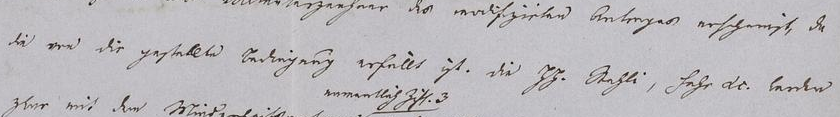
die von Dir gestellte Bedingung erfüllt ist. Die HH. Stehli, Fehr &c. werden
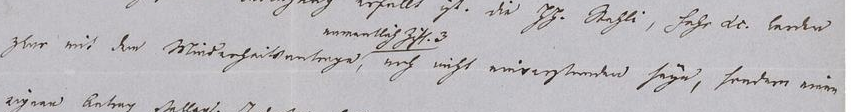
zwar mit dem Minderheitsantrage namentlich Ziff. 3, noch nicht einverstanden seyn, sondern einen
